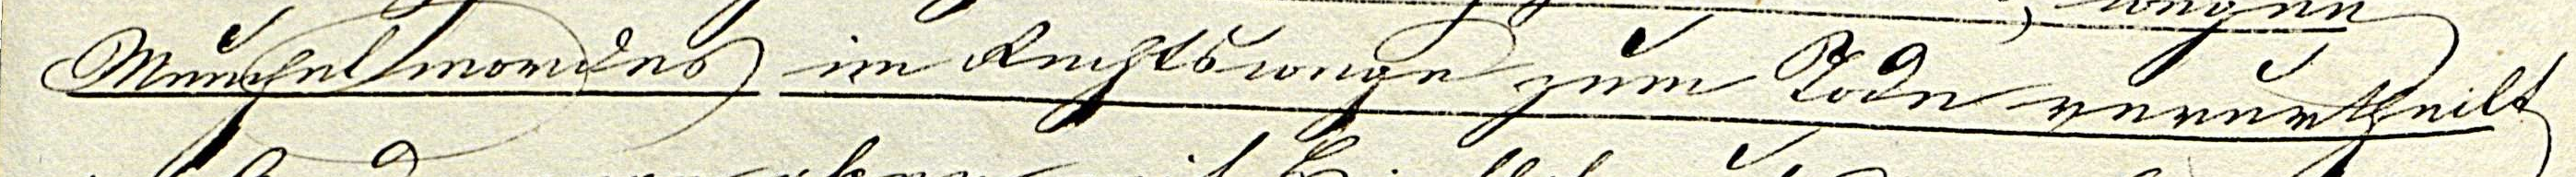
Meuchelmordes im Rechtswege zum Tode verurtheilt
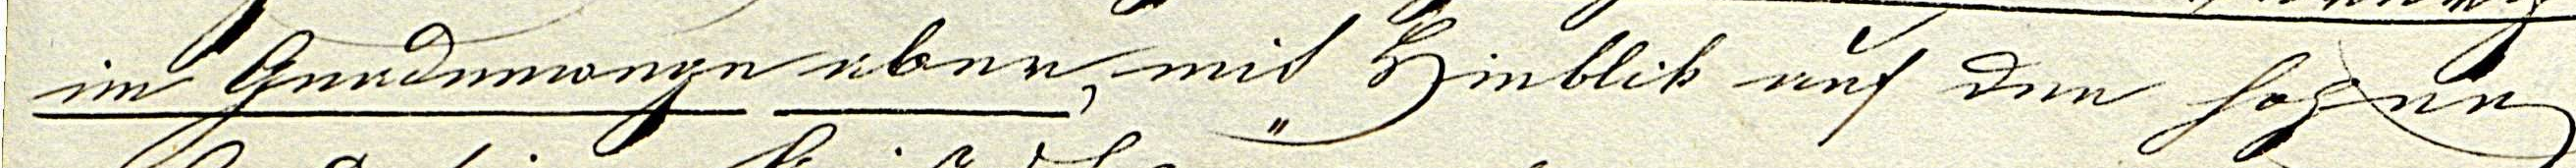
im Gnadenwege aber, mit Hinblik auf den hohen
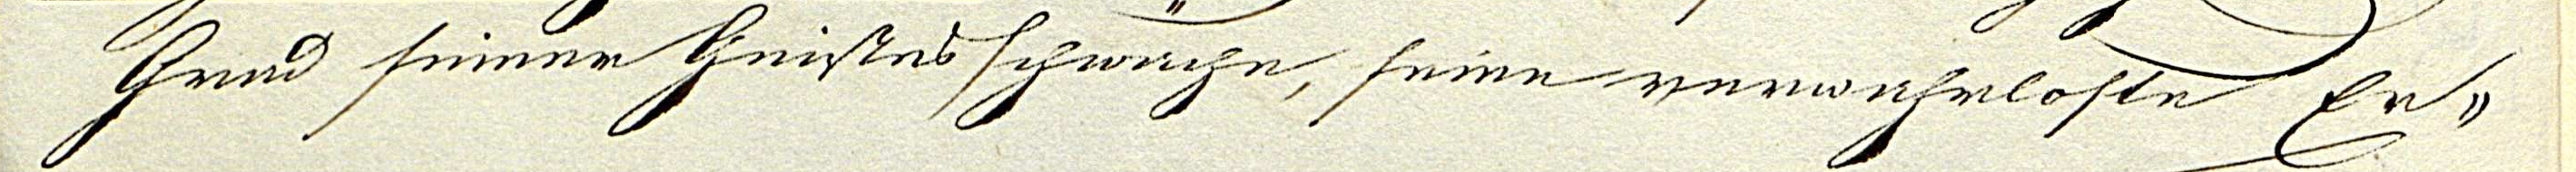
Grad seiner Geistesschwäche, seine verwahrloste Er¬
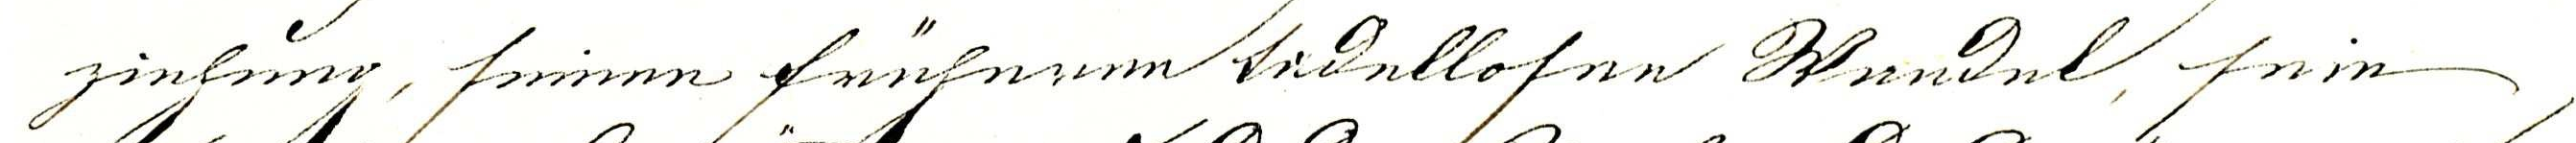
ziehung, seinen früheren tadellosen Wandel, sein
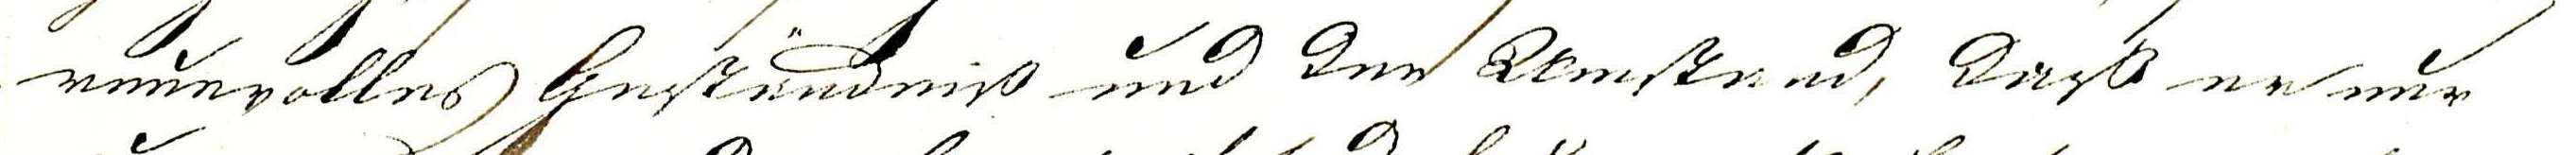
reuevolles Geständniß und den Umstand, daß er nur
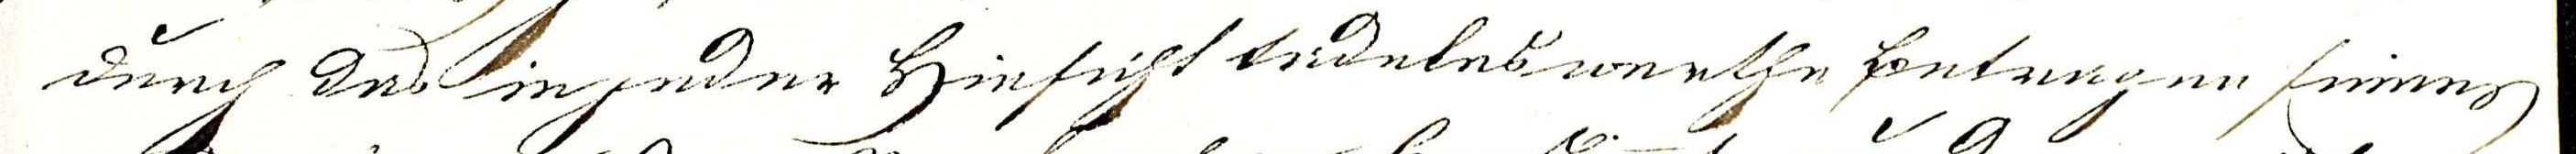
durch das in jeder Hinsicht tadelnswerthe Betragen seines
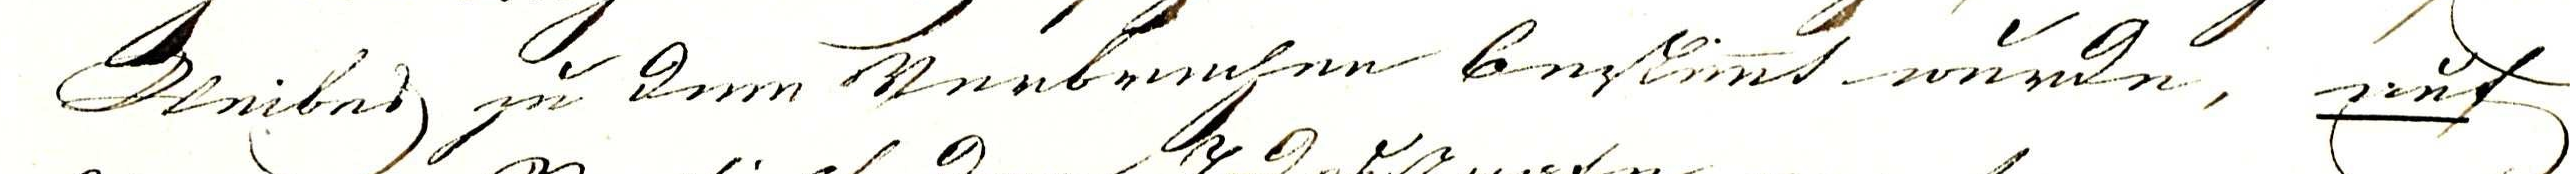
Weibes zu dem Verbrechen bestimmt wurde, auf
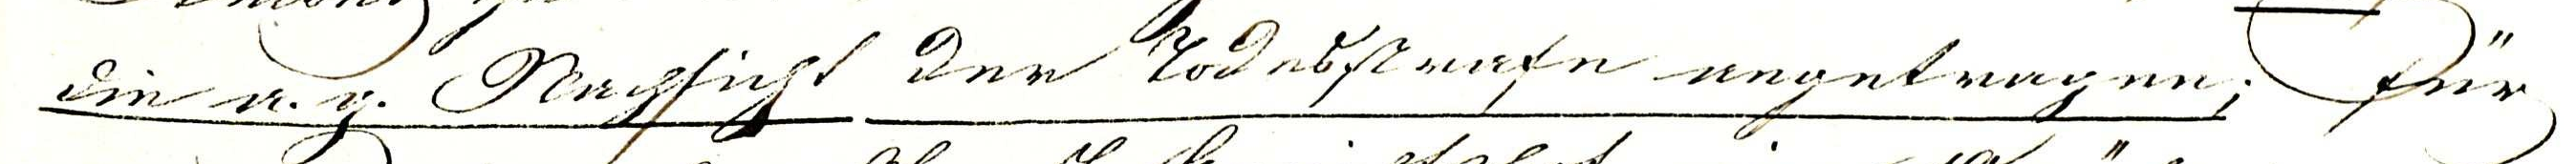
die a. g. Nachsicht der Todesstrafe angetragen; für
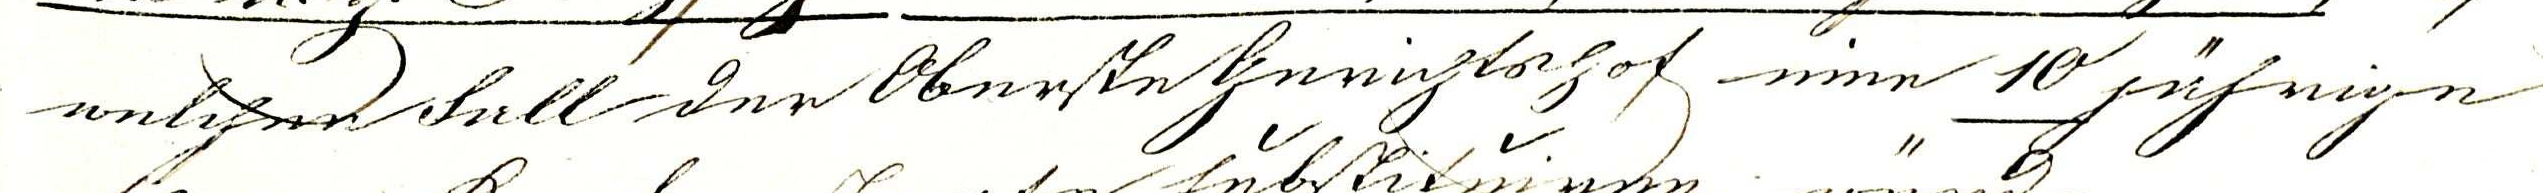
welchen Fall der Oberste Gerichtshof eine 10 jährige
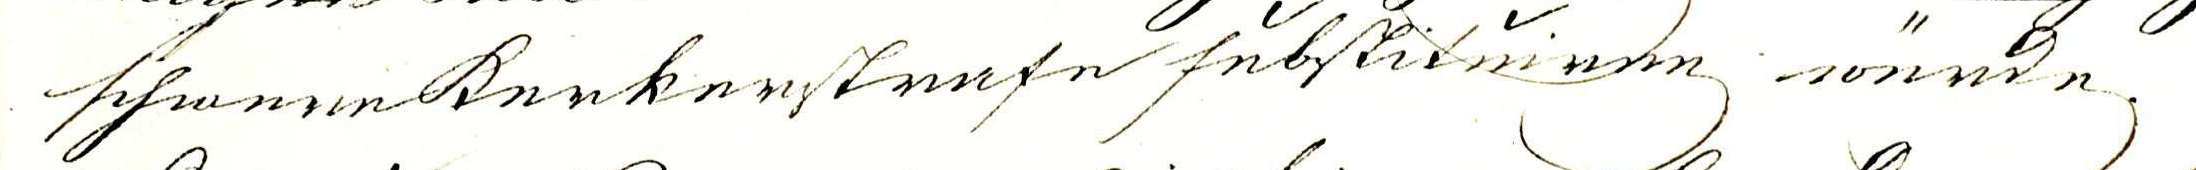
schwere Kerkerstrafe substituiren würde.
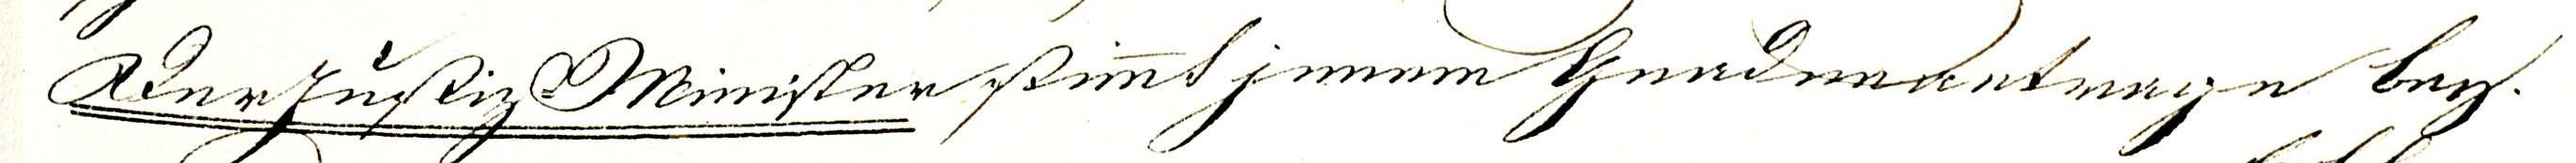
Der Justiz=Minister stimmt jenem Gnadenantwage bey.
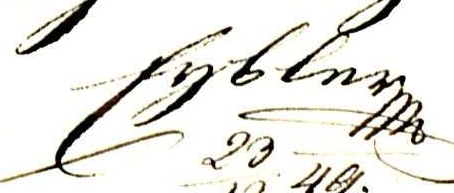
Eybler
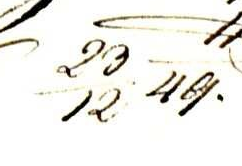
23/12 49
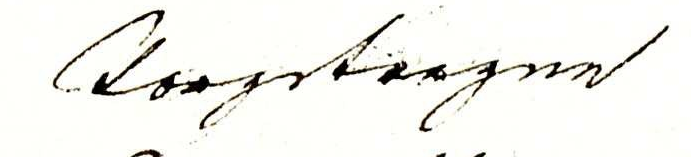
Vorgetragen
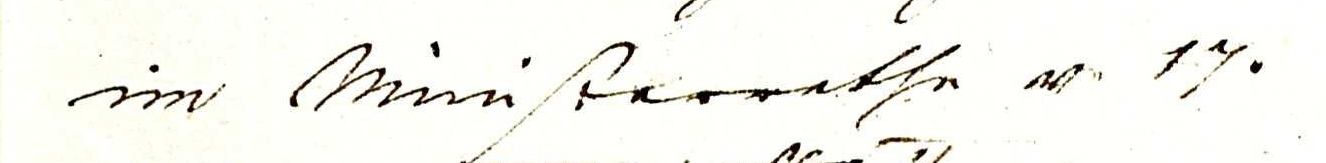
im Ministerrathe v. 17.
